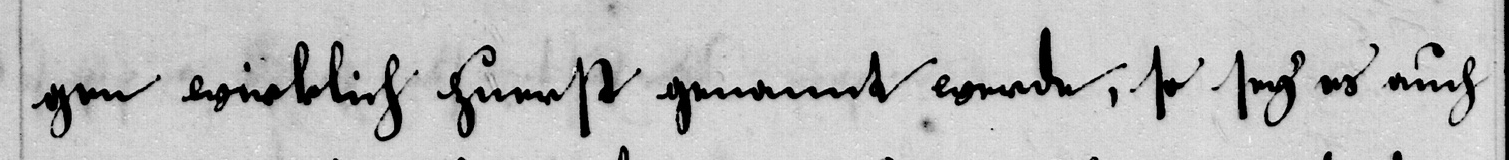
gen wirklich zuerst genannt werde, so sey es auch
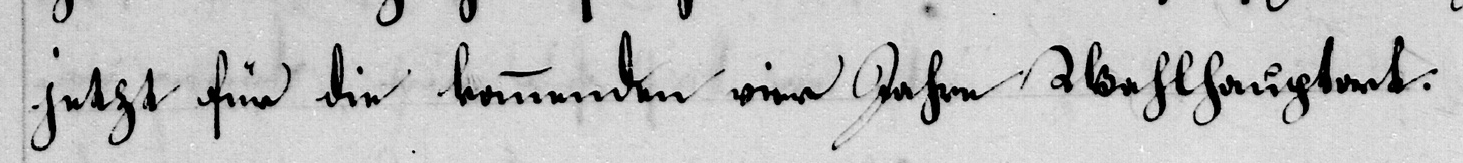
jetzt für die kommenden vier Jahre Wahlhauptort.
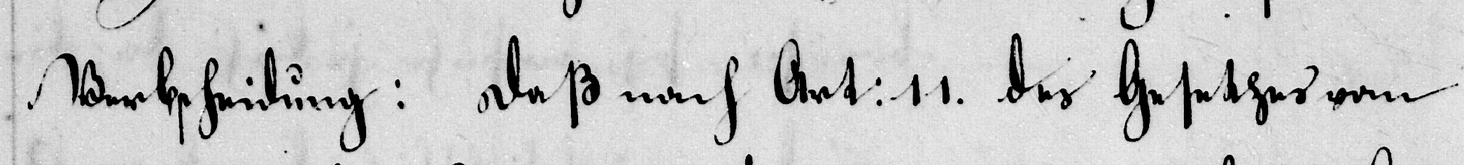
Verbscheidung: daß nach Art: 11. des Gesetzes vom
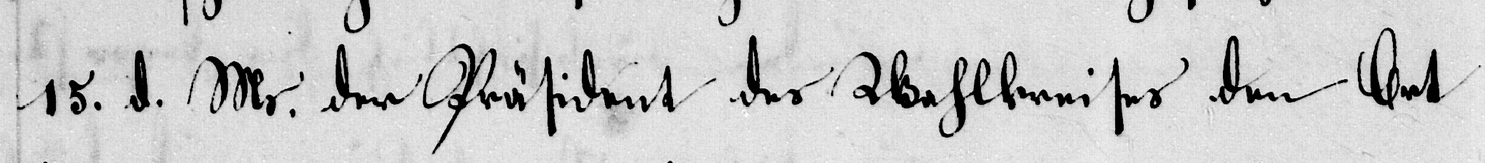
15. d. Ms. der Präsident des Wahlkreises den Ort
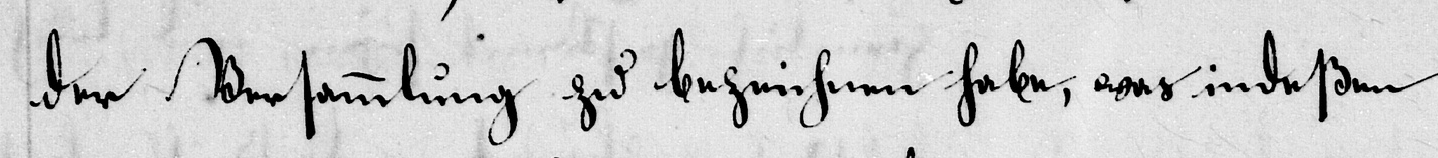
der Versammlung zu bezeichnen habe, was indeßen
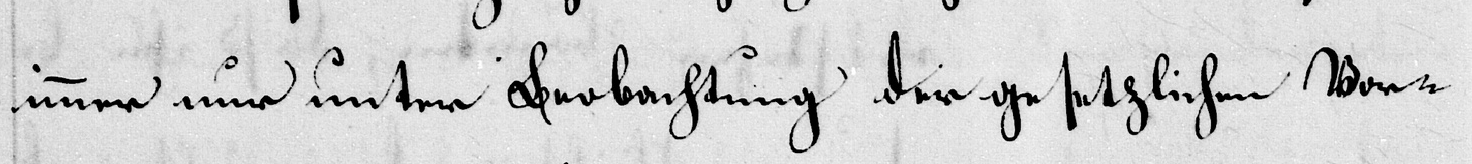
immer nur unter Beobachtung der gesetzlichen Vor¬
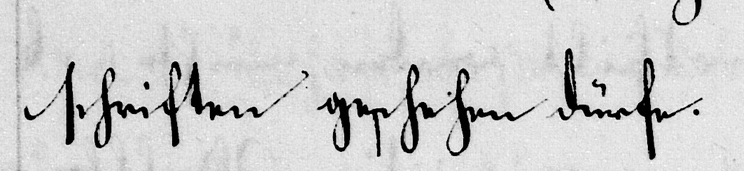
schriften geschehen dürfe.
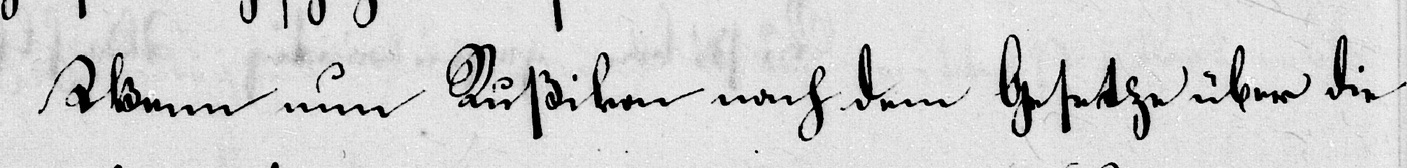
Wenn nun Rußikon nach dem Gesetze über die
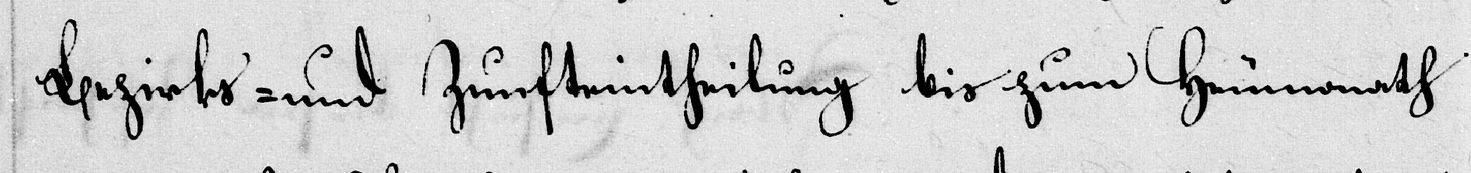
Bezirks- und Zunfteintheilung bis zum Heumonath
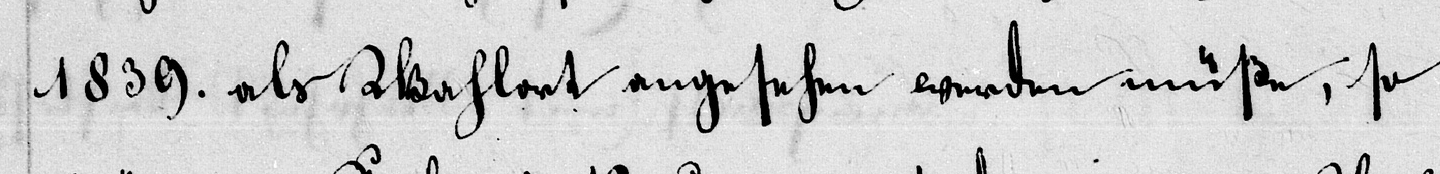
1839. als Wahlort angesehen werden müße, so
